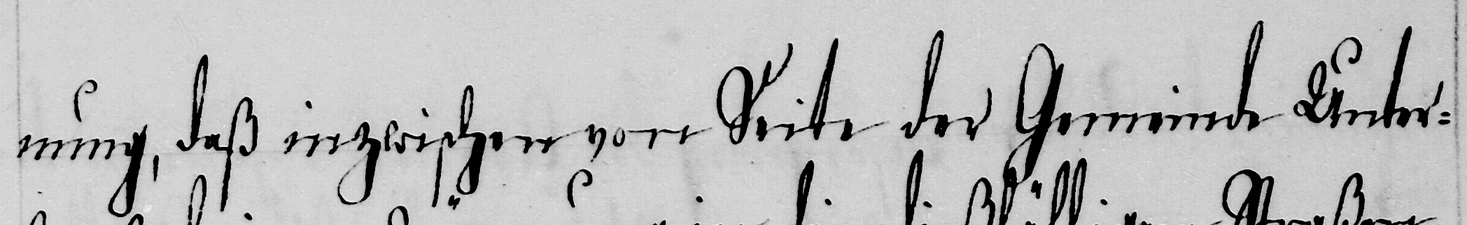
nung, daß inzwischen von Seite der Gemeinde Unter¬
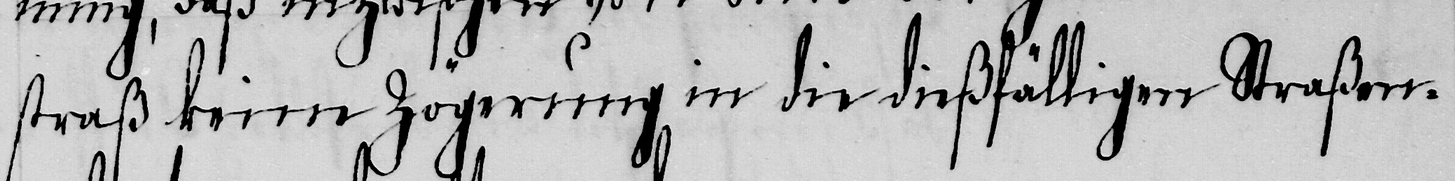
straß keine Zögerung in die dießfälligen Straßen¬
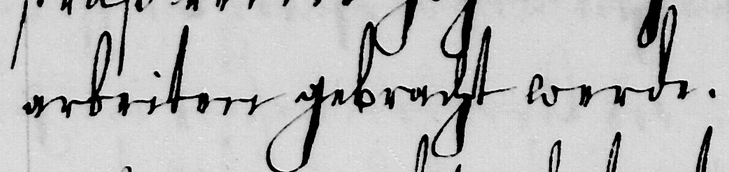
arbeiten gebracht werde.
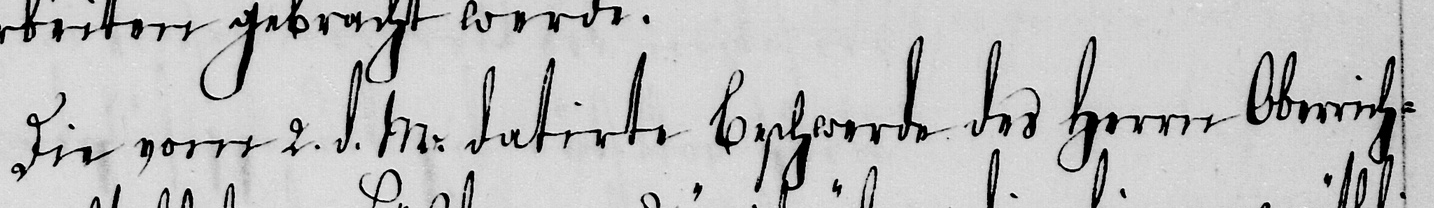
Die vom 2. d. M. datirte Beschwerde des Herrn Oberrich¬
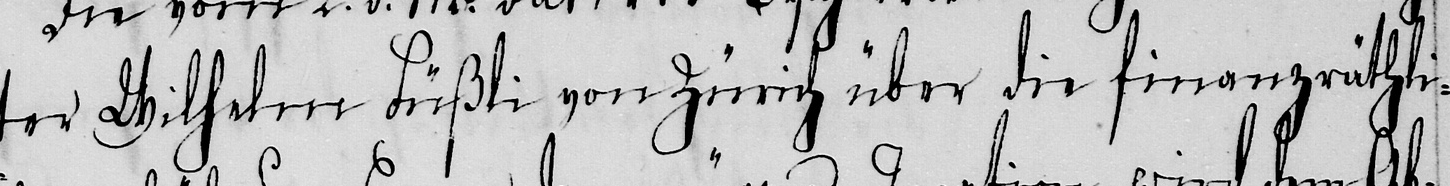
ter Wilhelm Füßli von Zürich über die finanzräthli¬
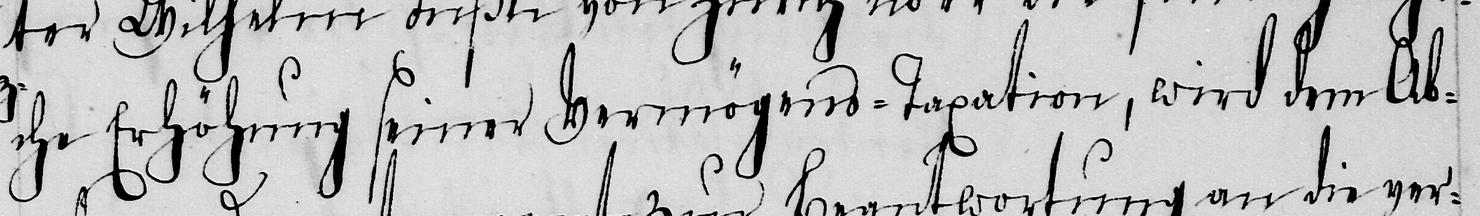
che Erhöhung seiner Vermögens-Taxation, wird dem Ab¬
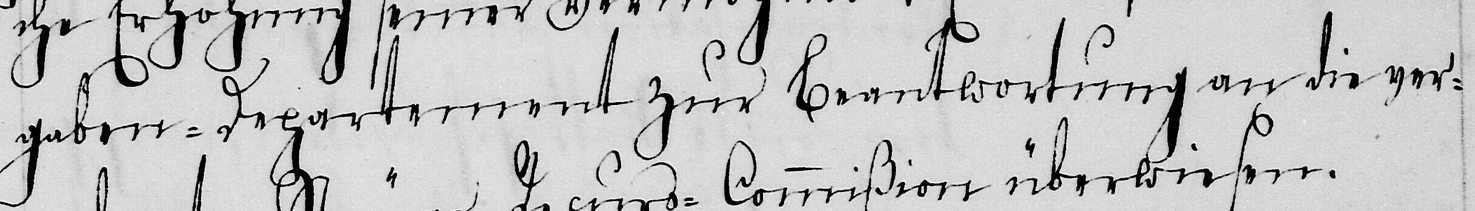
gaben-Departement zur Beantwortung an die ver¬
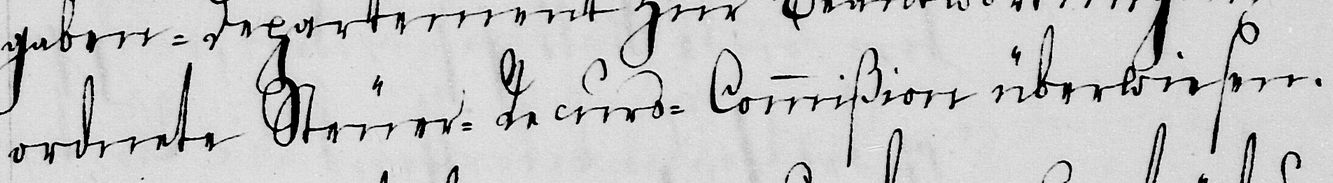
ordnete Steuer-Recurs-Commißion überwiesen.
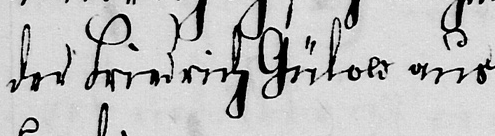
der Friedrich Gülow aus
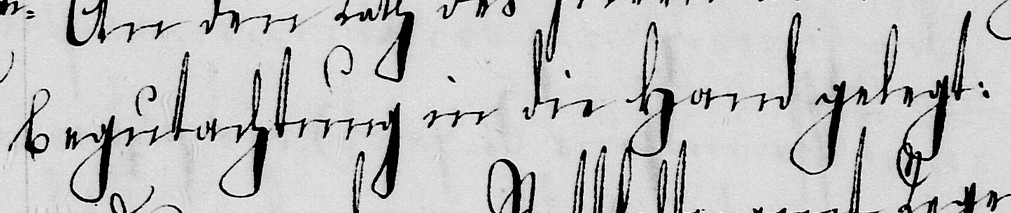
Begutachtung in die Hand gelegt:
